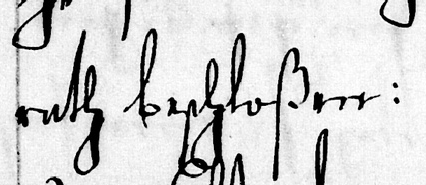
rath beschloßen:
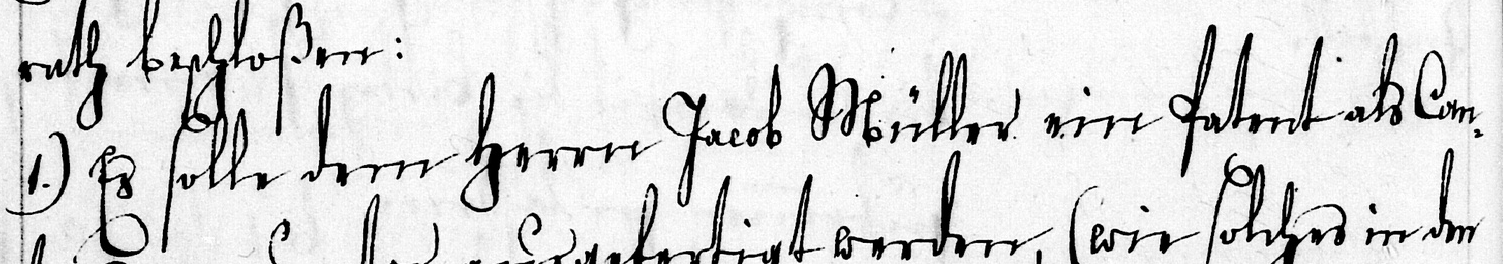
1.) Es solle dem Herrn Jacob Müller ein Patent als Ca¬
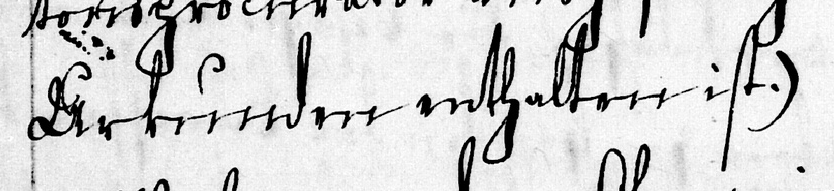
Urkunden enthalten ist.)
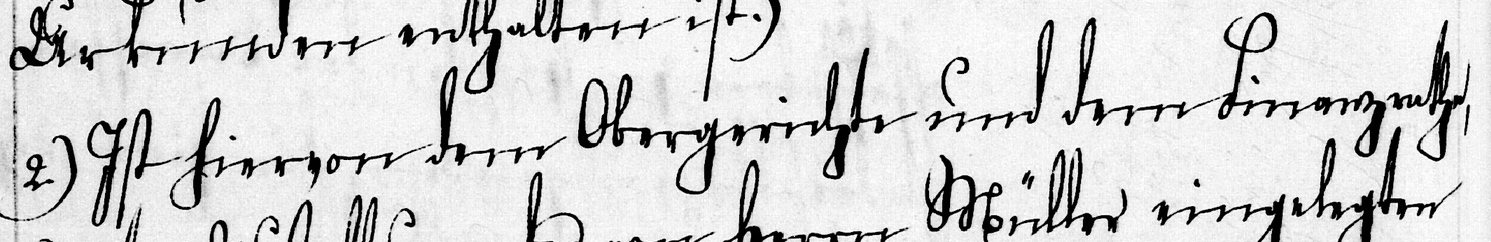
2.) Ist hiervon dem Obergerichte und dem Finanzrathe,
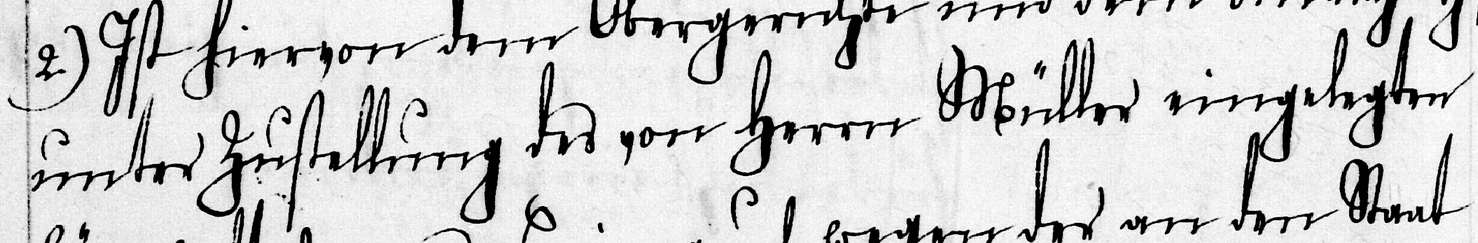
unter Zustellung des von Herrn Müller eingelegten
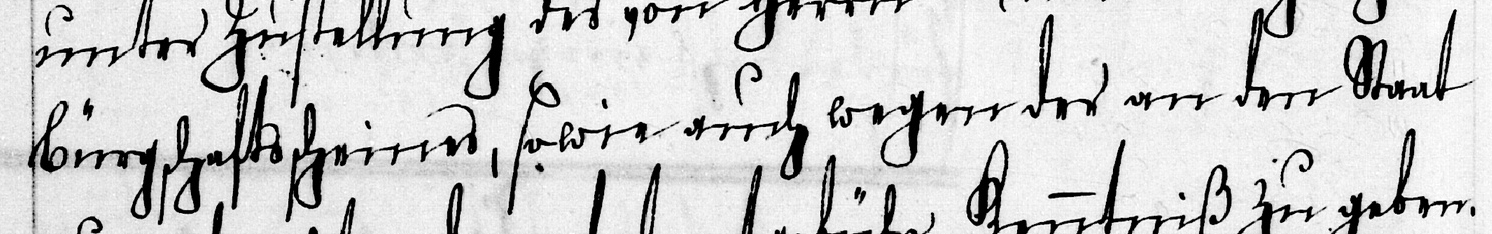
Bürgschaftsscheines, sowie auch wegen der an den Staat
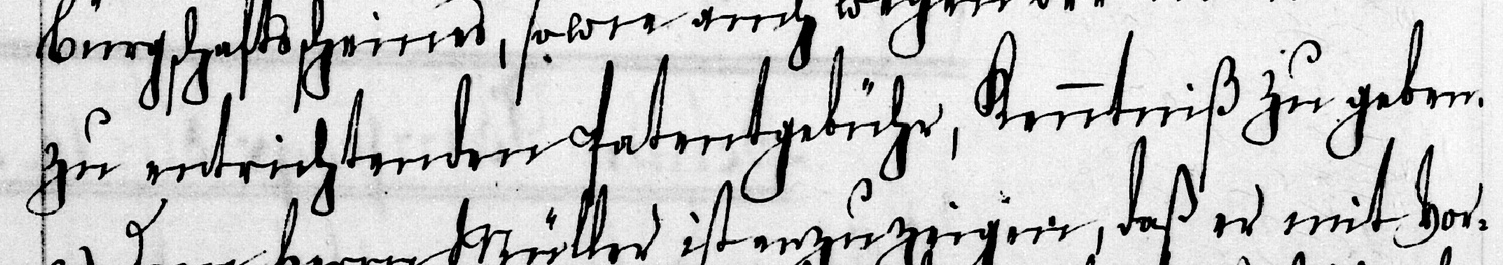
zu entrichtenden Patentgebühr, Kenntniß zu geben.
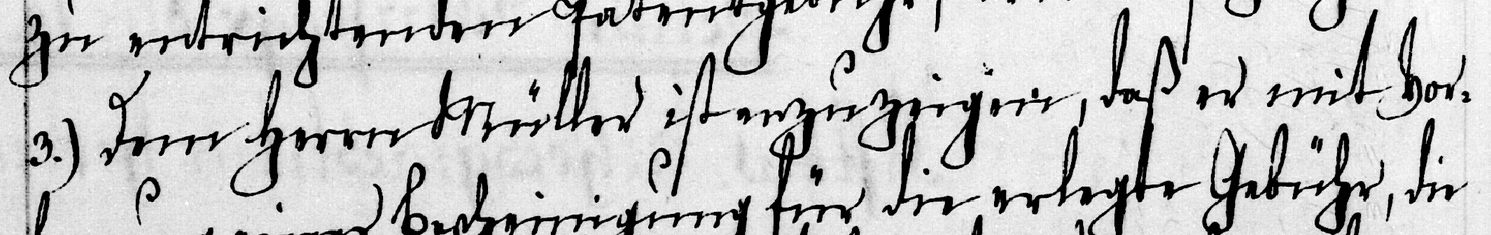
3.) Dem Herrn Müller ist anzuzeigen, daß er mit Vor¬
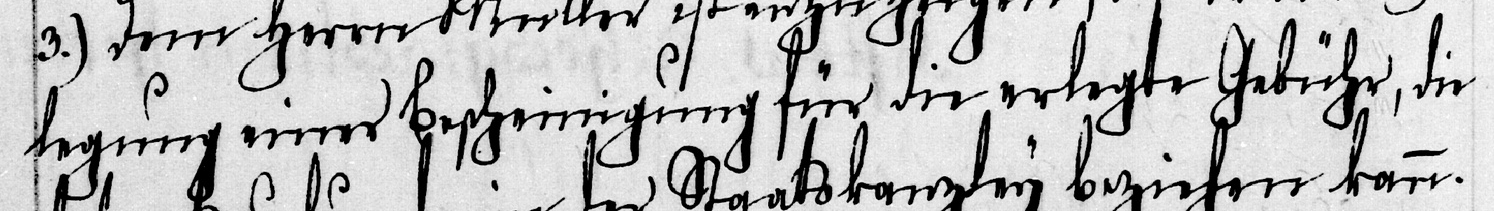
legung einer Bescheinigung für die erlegte Gebühr, die
